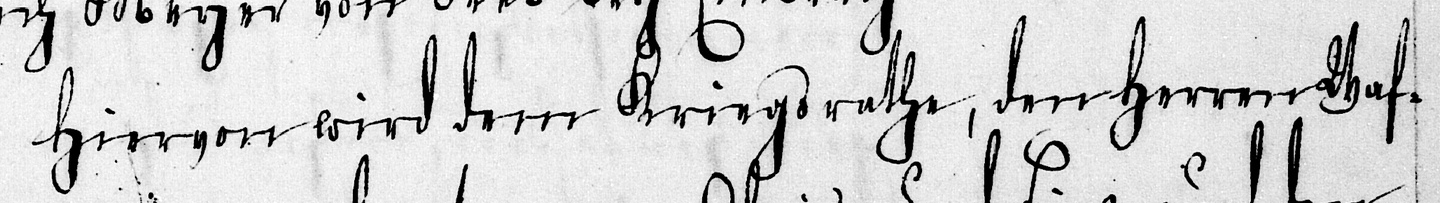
Hiervon wird dem Kriegsrathe, den Herren Waf¬
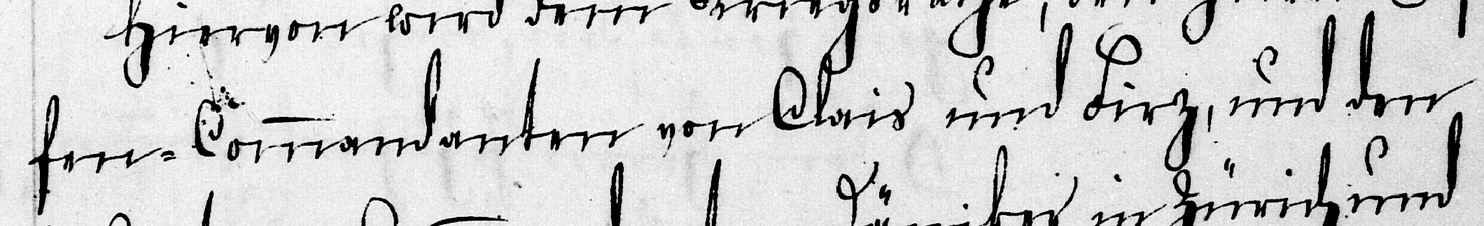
fen-Commandanten von Clais und Firz, und den
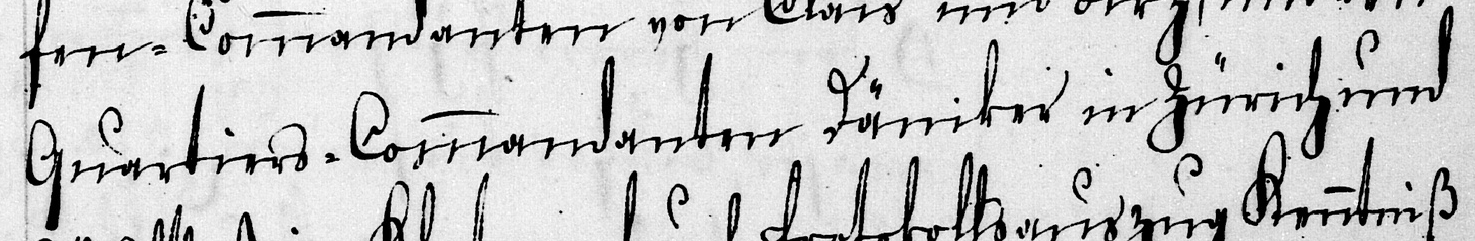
Quartiers-Commandanten Däniker in Zürich und
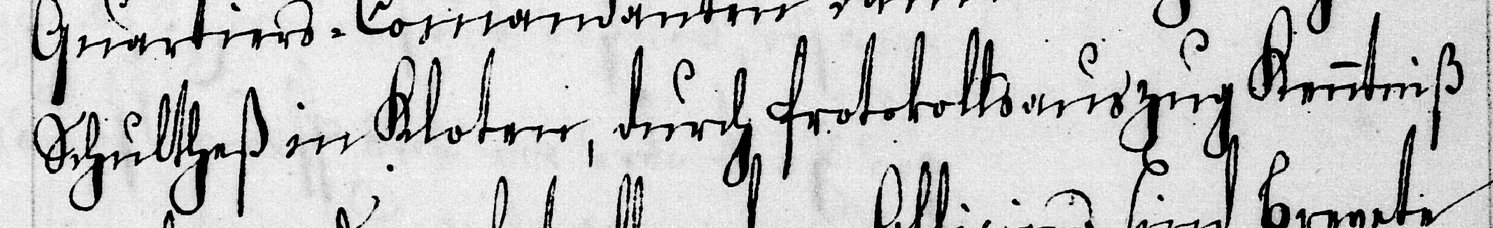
Schultheß in Kloten, durch Protokollsauszug Kenntniß
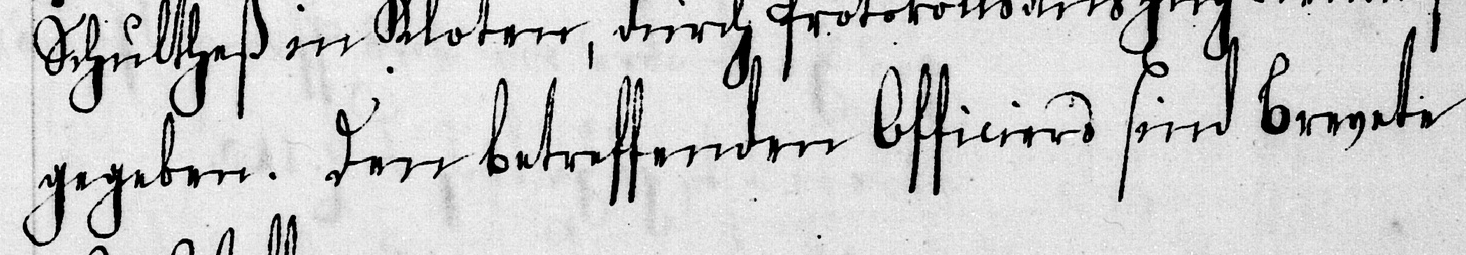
gegeben. Den betreffenden Officiers sind Brevete
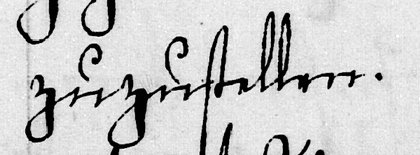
zuzustellen.
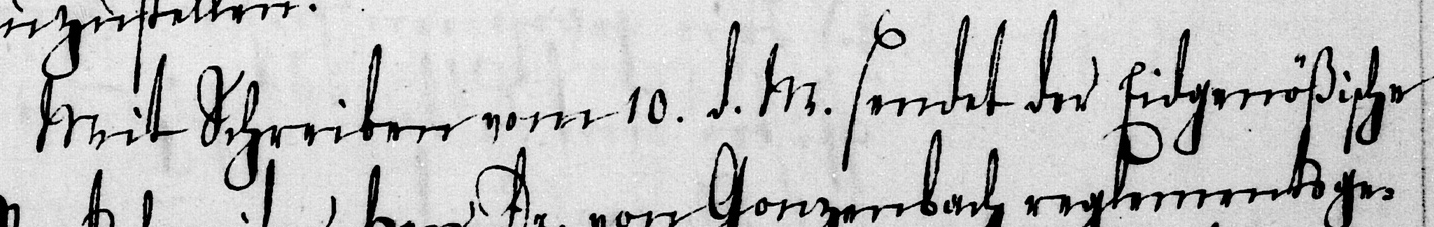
Mit Schreiben vom 10. d. M. sendet der Eidgenößische
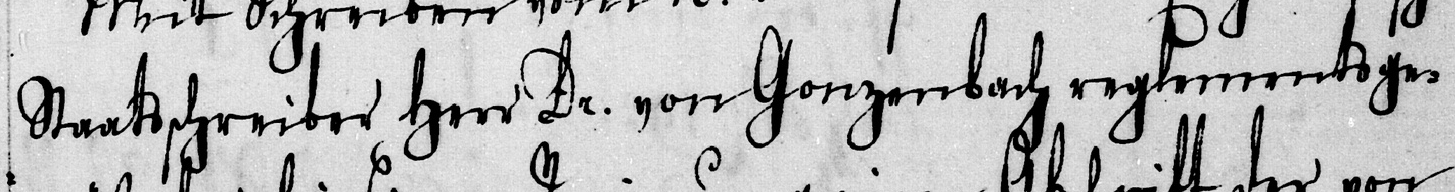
Staatsschreiber Herr. Dr. von Gonzenbach reglementsge¬
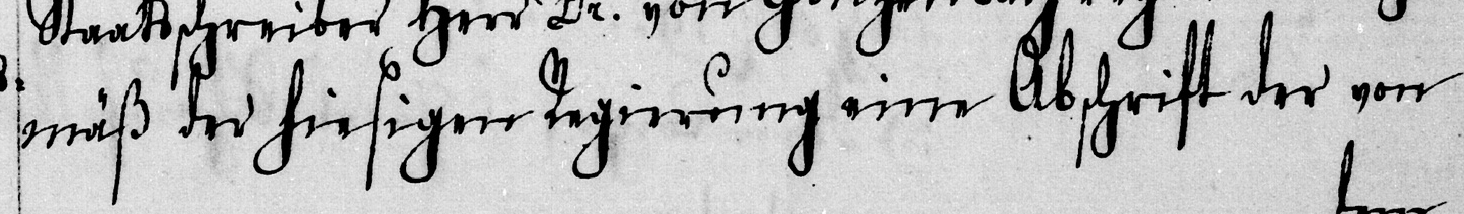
mäß der hiesigen Regierung eine Abschrift der von
